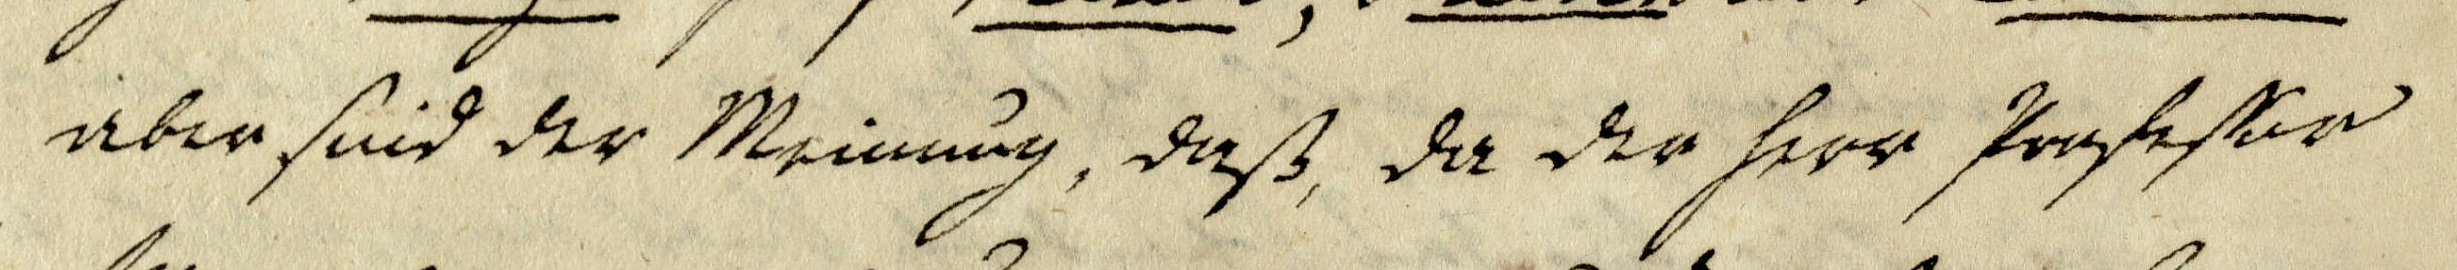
aber sind der Meinung, daß, da der Herr Professor
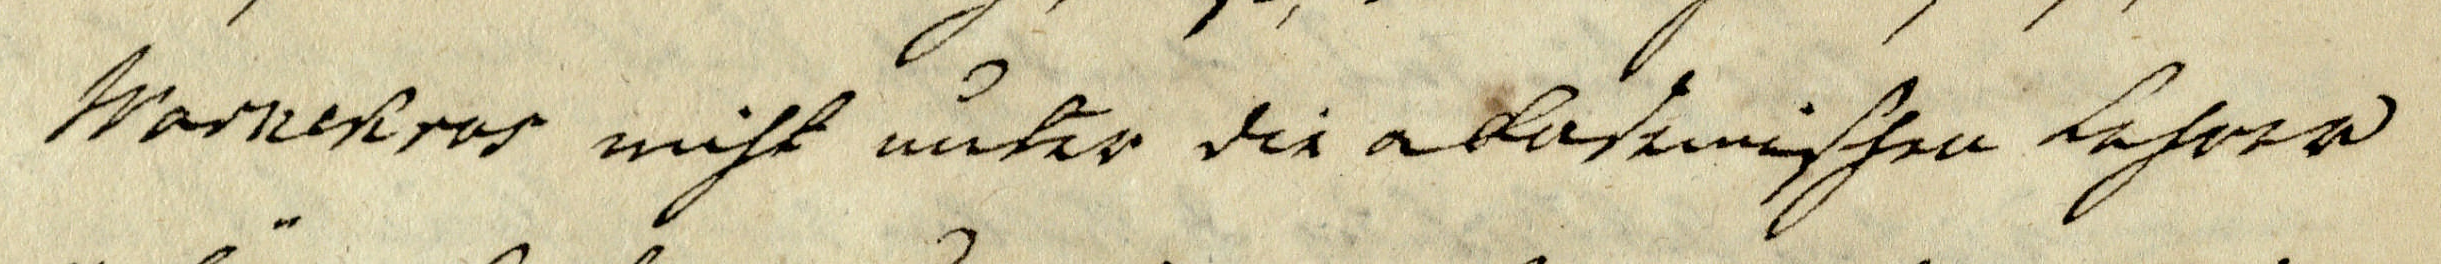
Warnekros nicht unter die akademischen Lehrer
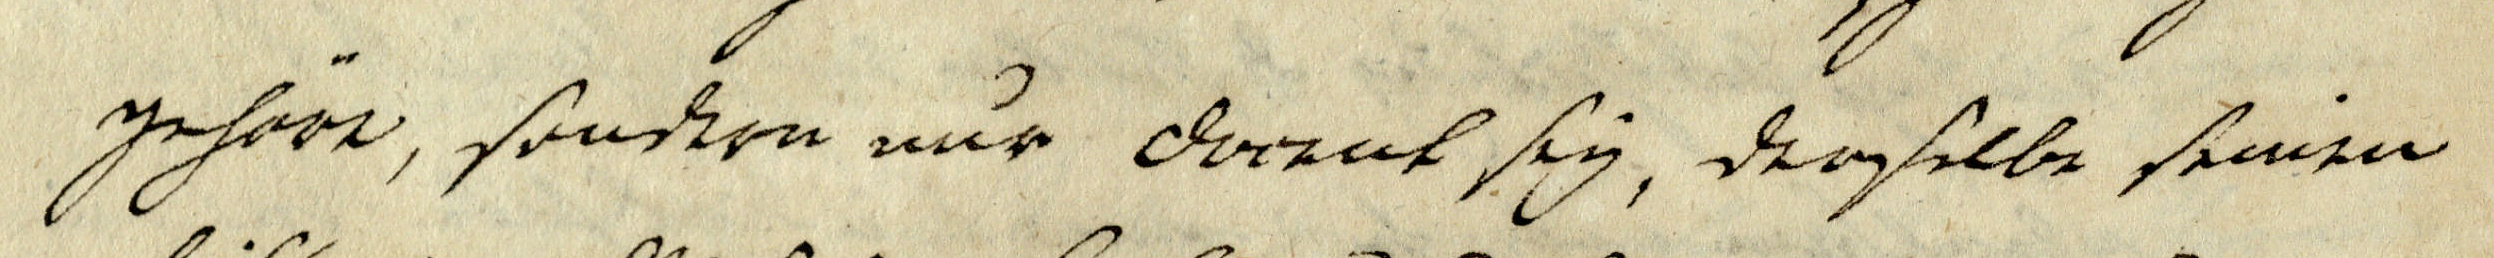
gehöre, sondern nur Docent seÿ, derselbe seinen
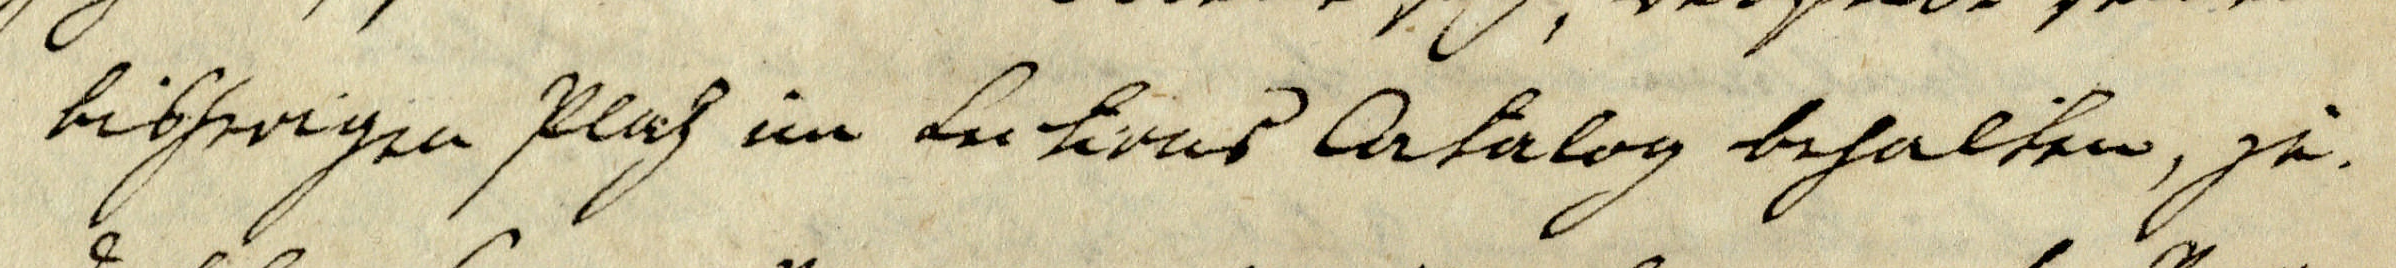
bisherigen Platz im Lections Catalog behalten, je¬
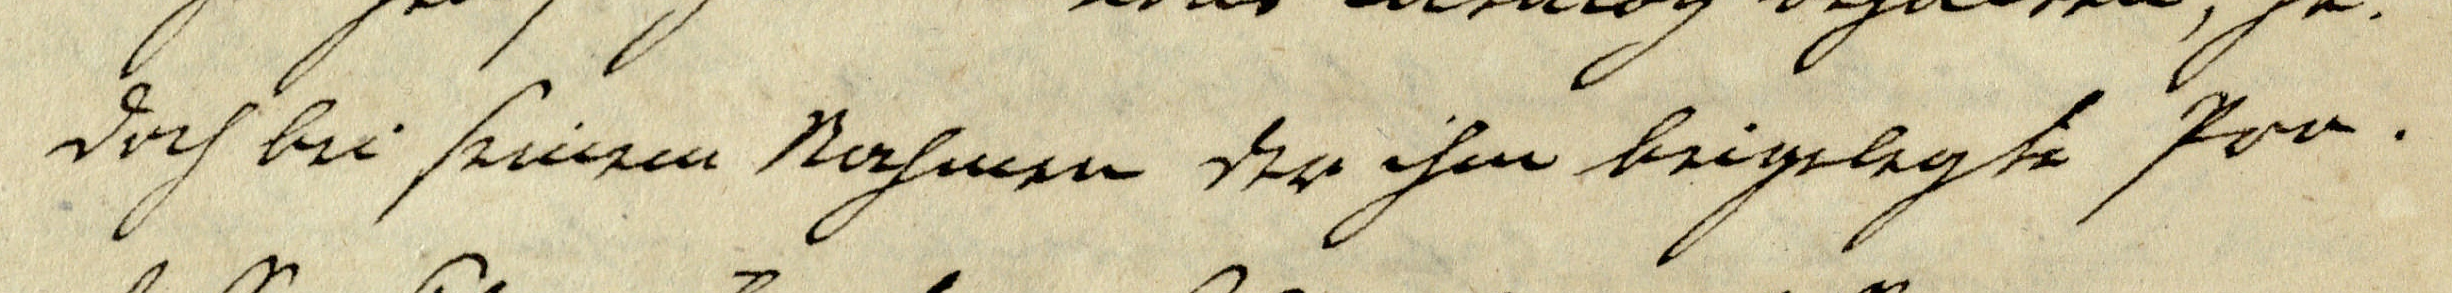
doch bei seinem Nahmen der ihm beigelegte Prof¬
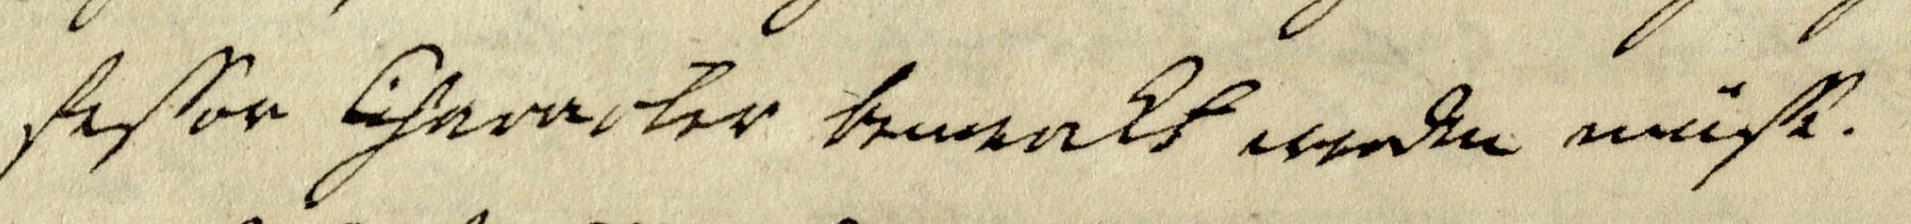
fessor Character bemerckt werden müsse.
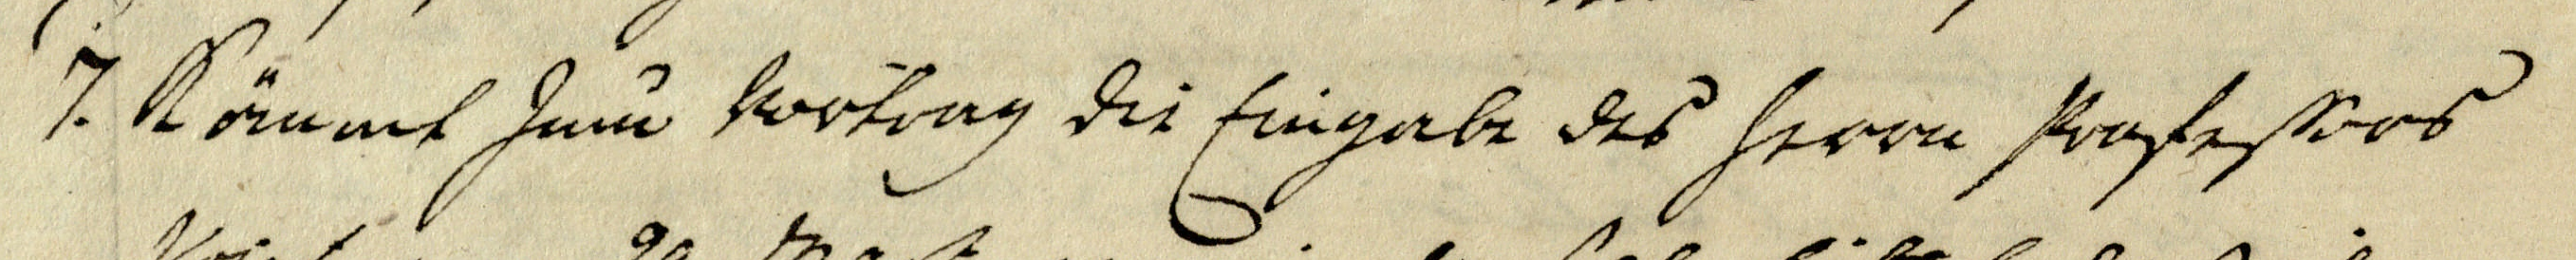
7. Kömmt zum Vortrag die Eingabe des Herrn Professors
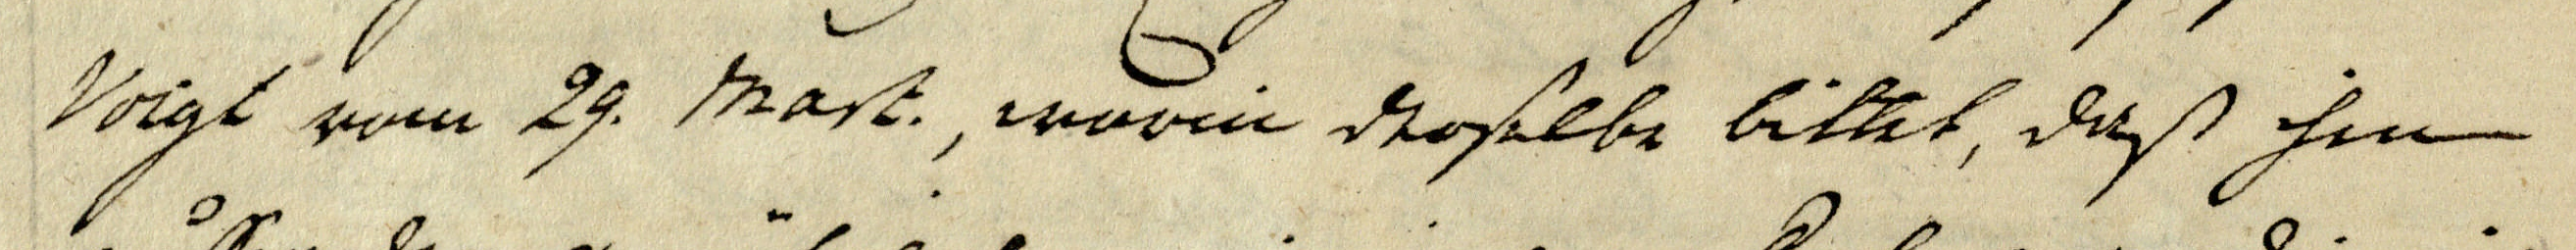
Voigt vom 29. Mart., worin derselbe bittet, daß ihm
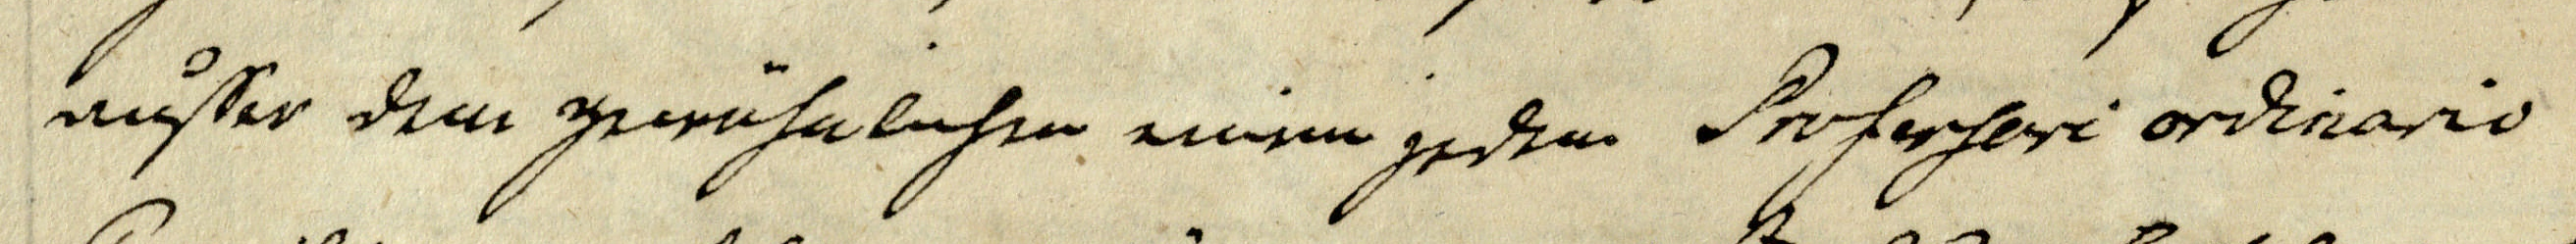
ausser dem gewöhnlichen einem jeden Professori ordinario
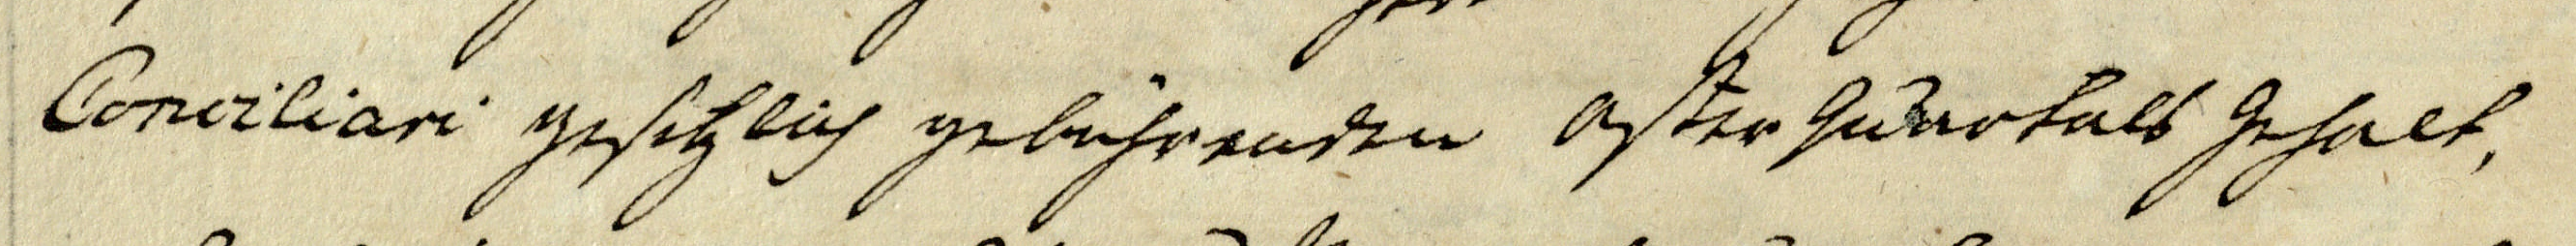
Conciliari gesetzlich gebührenden Oster Quartals Gehalt,
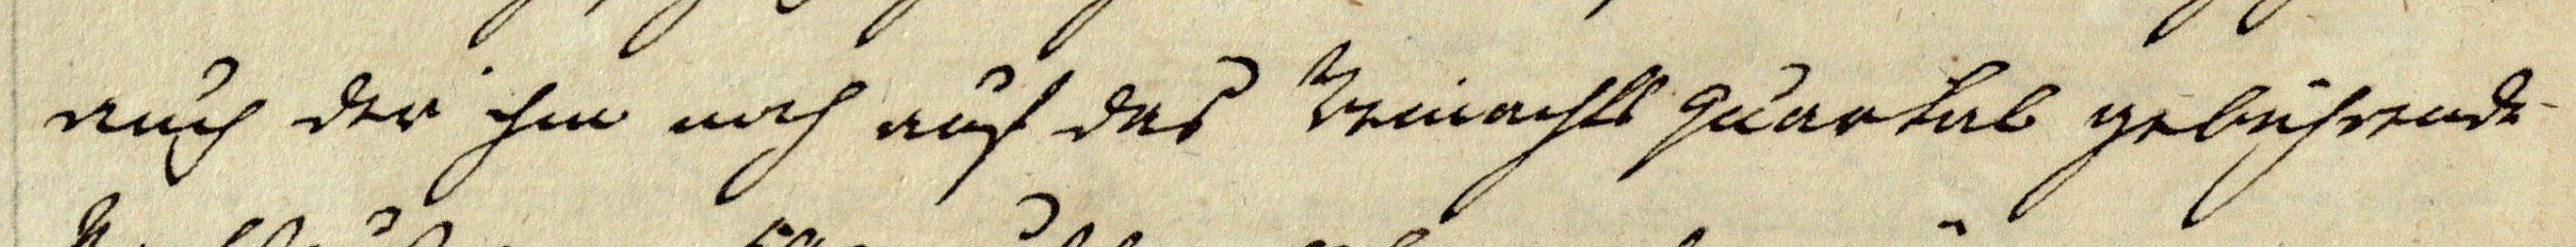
auch der ihm noch auf das Weinachts Quartal gebührende
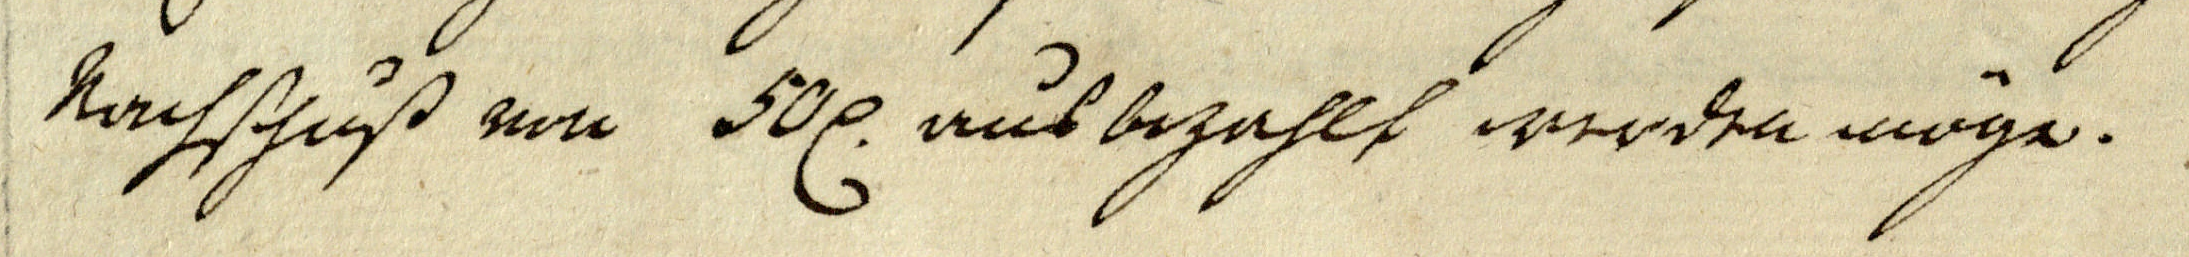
Nachschuß von 50 l. ausbezahlt werden möge.
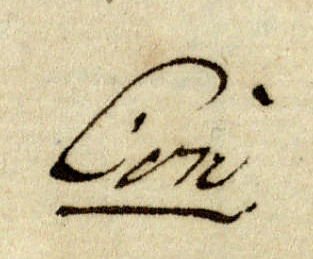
Con
